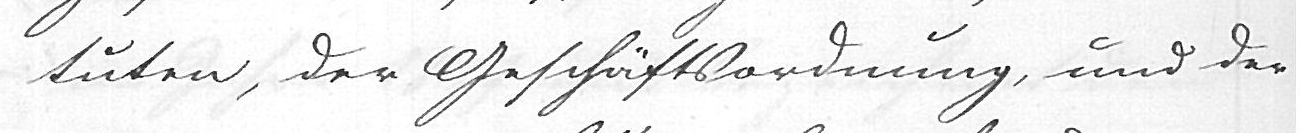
tuten, der Geschäftsordnung, und der
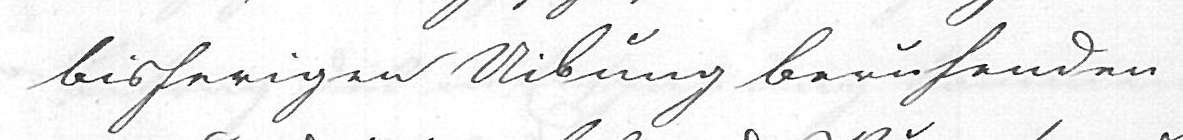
bisherigen Sitzung berufenden
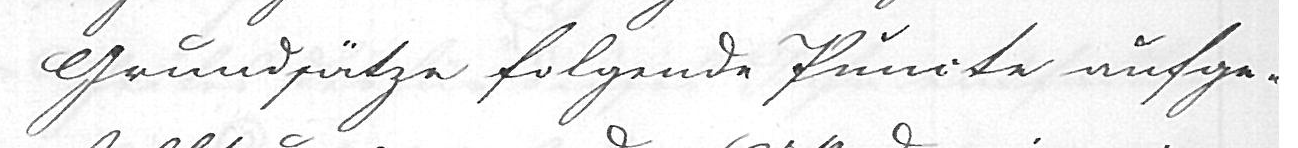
Grundsätze folgende Puncte aufge-
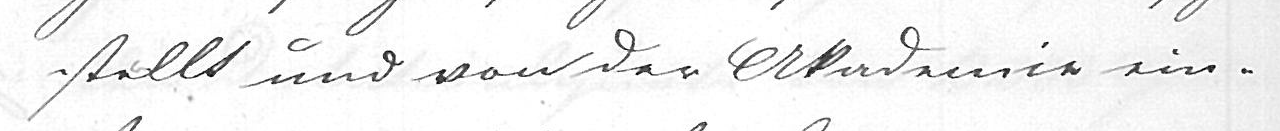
stellt und von der Akademie ein-
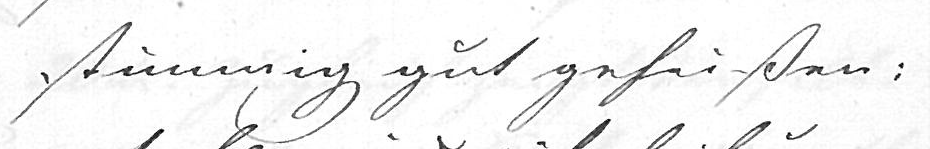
stimmig gut geheißen.
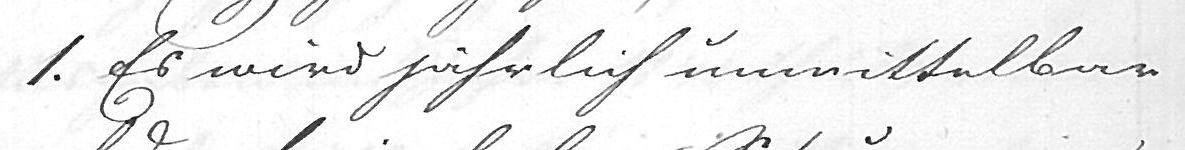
1. Es wird jährlich unmittelbar
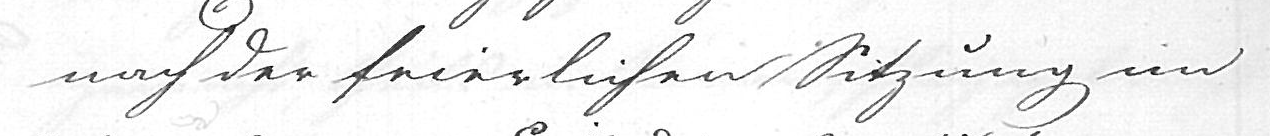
nach der feierlichen Sitzung im
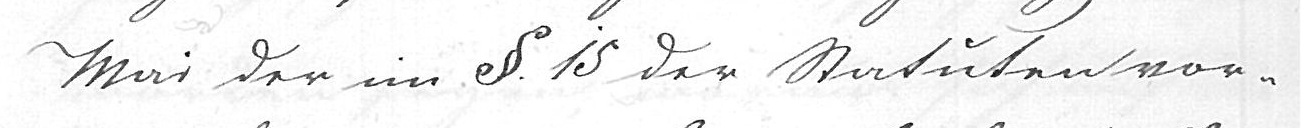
Mai der im § 15 der Statuten vor-
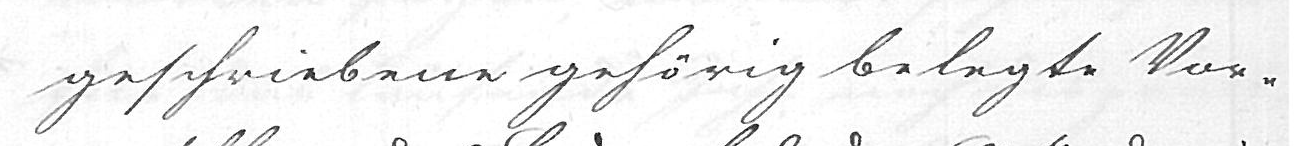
geschriebenen gehörig belegte Vor-
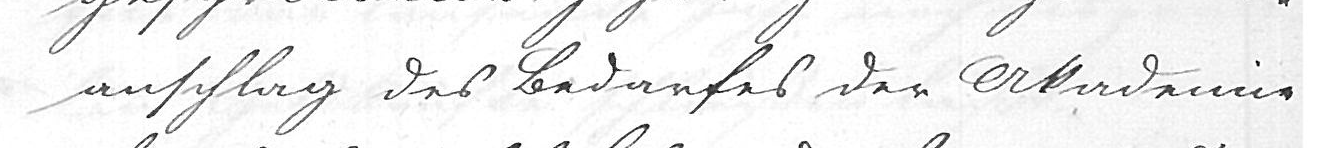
anschlag des Bedarfes der Akademie
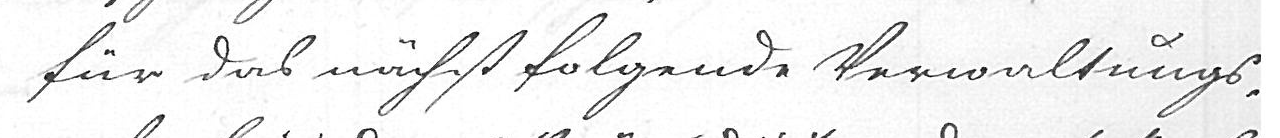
für das nächst folgende Verwaltungs-
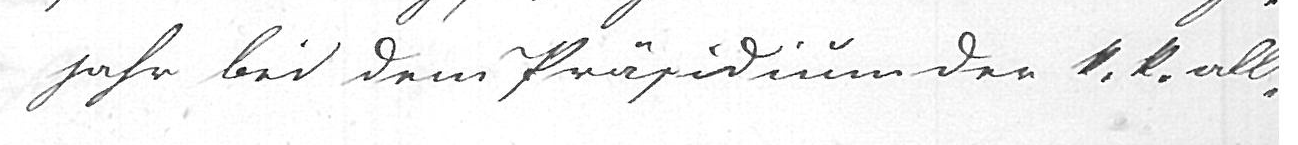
jahr bei dem Präsidium der k.k. all-
